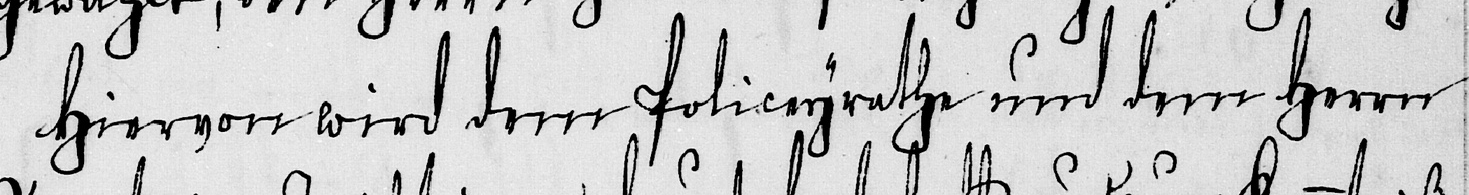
Hiervon wird dem Policeyrathe und dem Herren
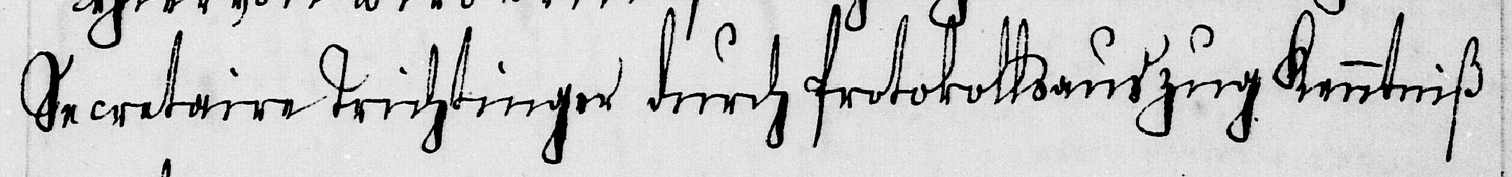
Secretaire Trichtinger durch Protokollsauszug Kenntniß
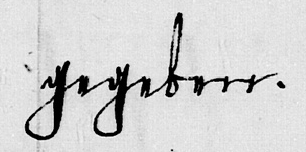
gegeben.
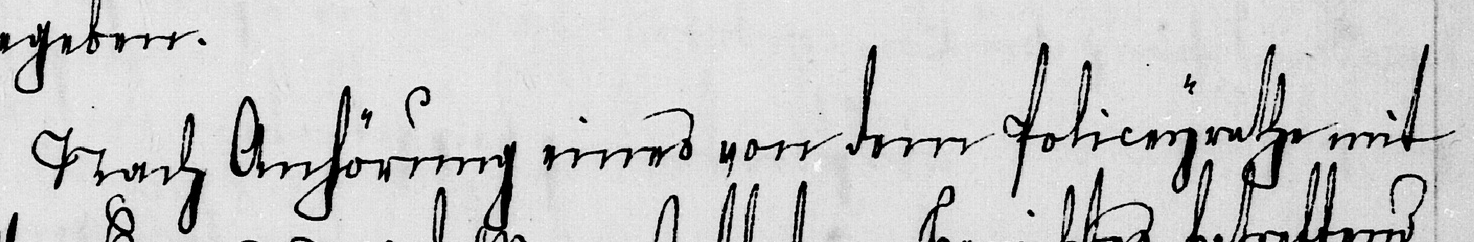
Nach Anhörung eines von dem Policeyrathe mit
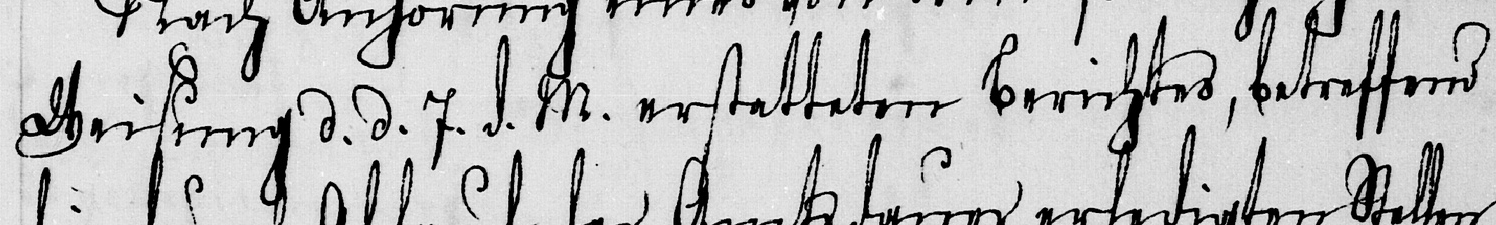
Weisung d. d. 7. d. M. erstatteten Berichtes, betreffend
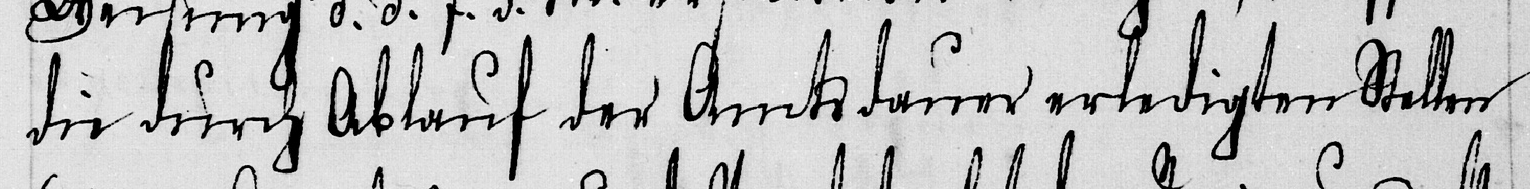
die durch Ablauf der Amtsdauer erledigten Stell¬
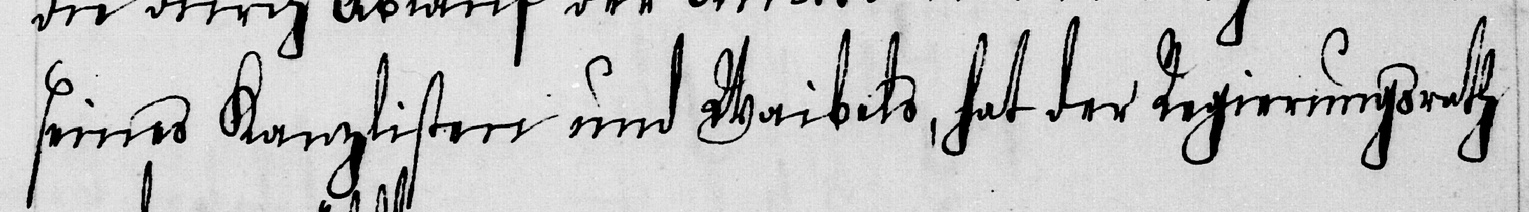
seines Kanzlisten und Waibels, hat der Regierungsrath
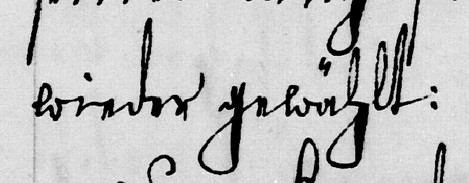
wieder gewählt:
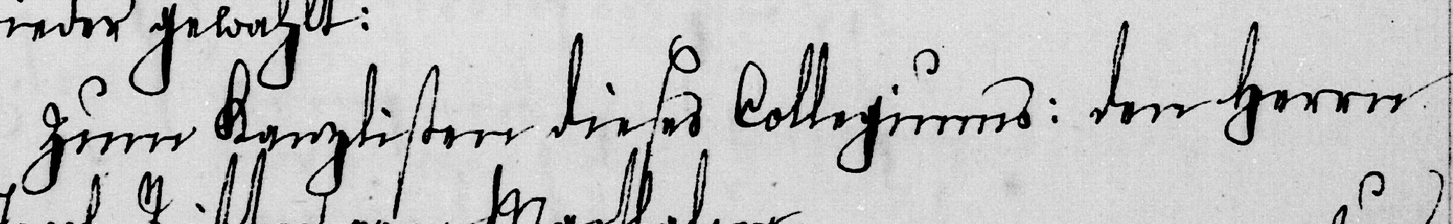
Zum Kanzlisten dieses Collegiums: den Herrn
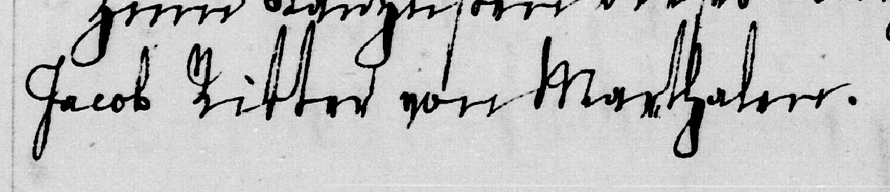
Jacob Ritter von Marthalen.
